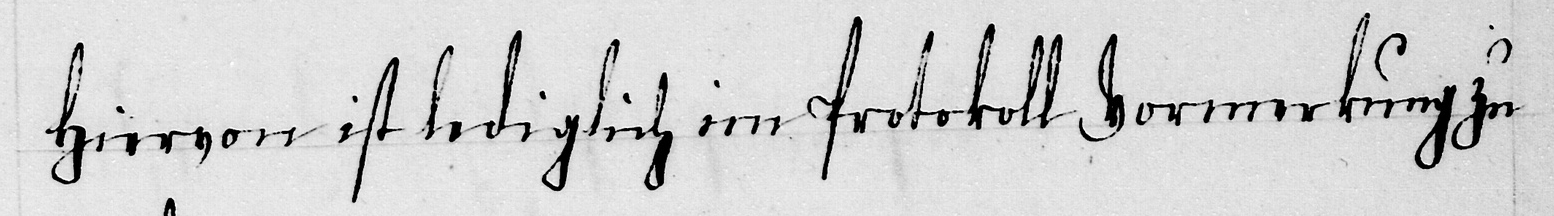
Hiervon ist lediglich im Protokoll Vormerkung zu
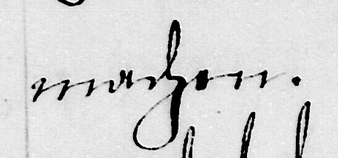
machen.
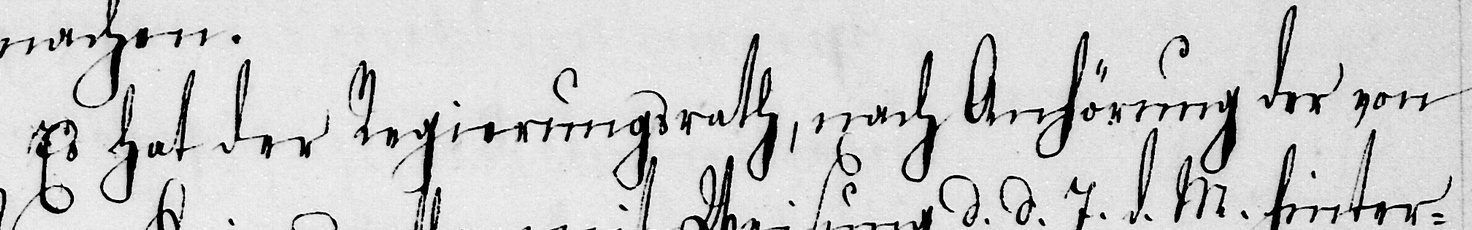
Es hat der Regierungsrath, nach Anhörung der von
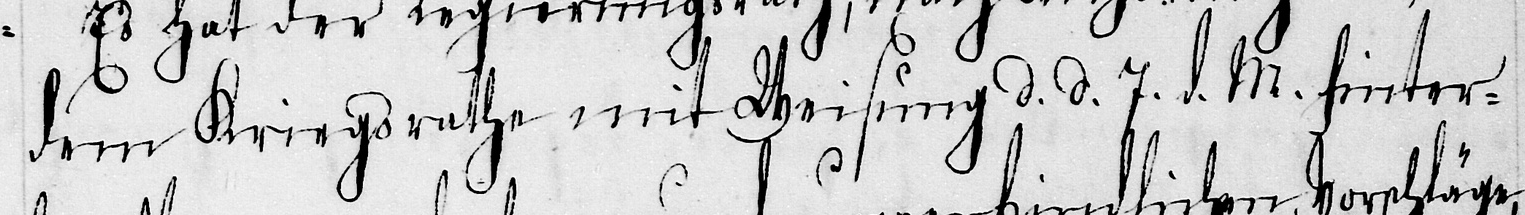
dem Kriegsrathe mit Weisung d. d. 7. d. M. hinter¬
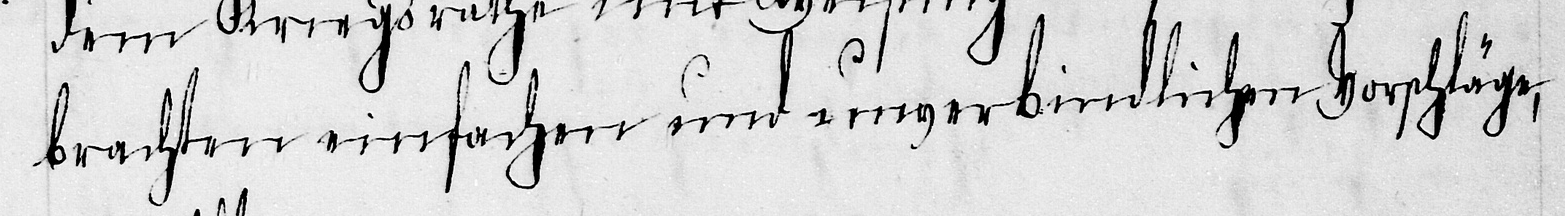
brachten einfachen und unverbindlichen Vorschläge,
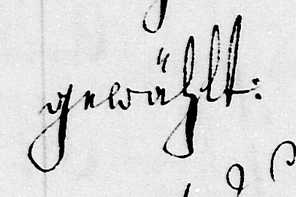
gewählt:
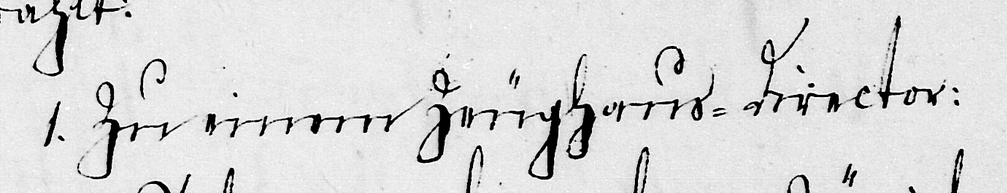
1. Zu einem Zeughaus-Director:
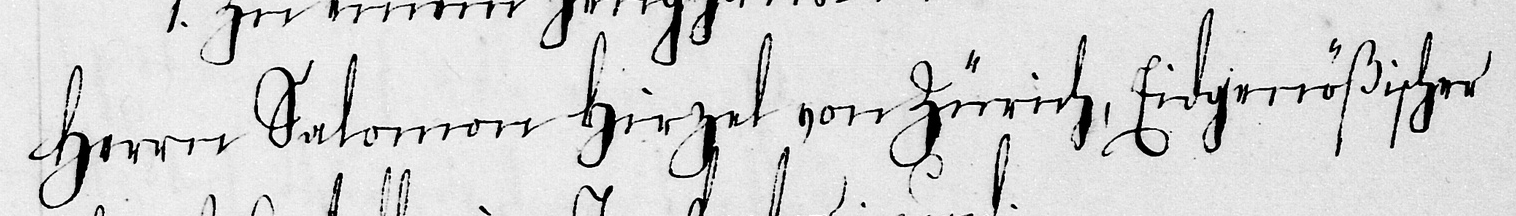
Herrn Salomon Hirzel von Zürich, Eidgenößischer
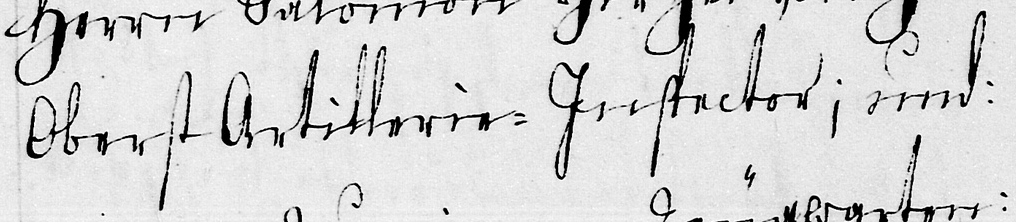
Oberst Artillerie-Inspector; und:
